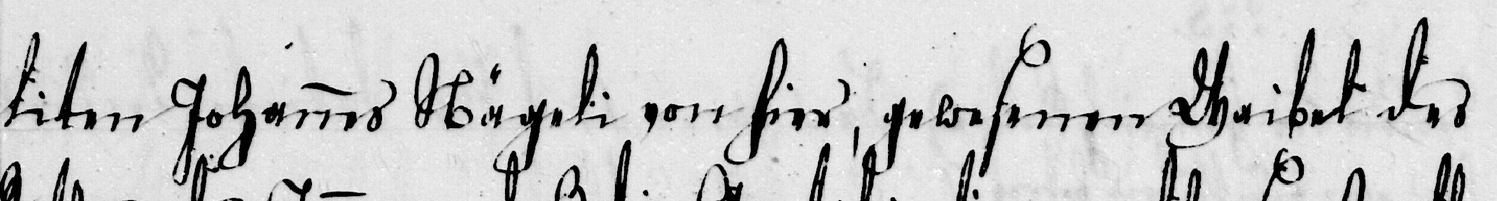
liten Johannes Nägeli von hier, gewesenen Waibel des
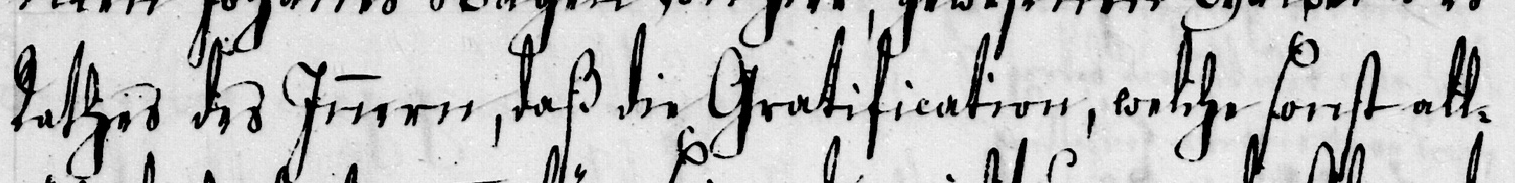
Rathes des Innern, daß die Gratification, welche sonst all¬
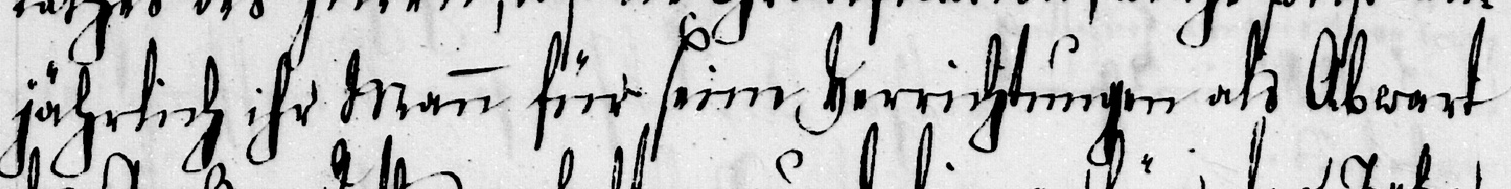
jährlich ihr Mann für seine Verrichtungen als Abwart
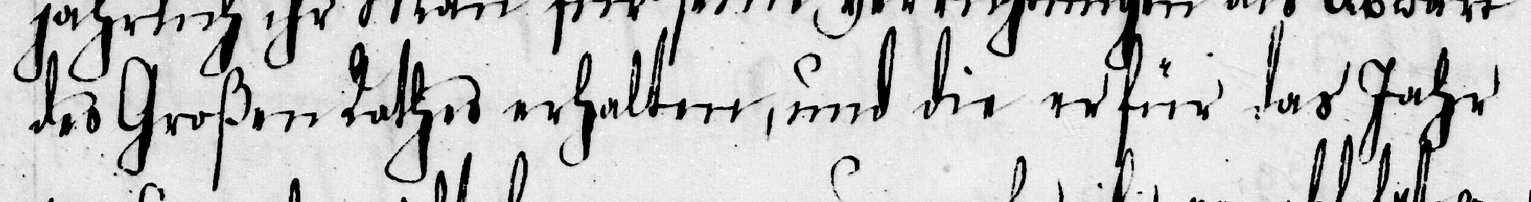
des Großen Rathes erhalten, und die er für das Jahr
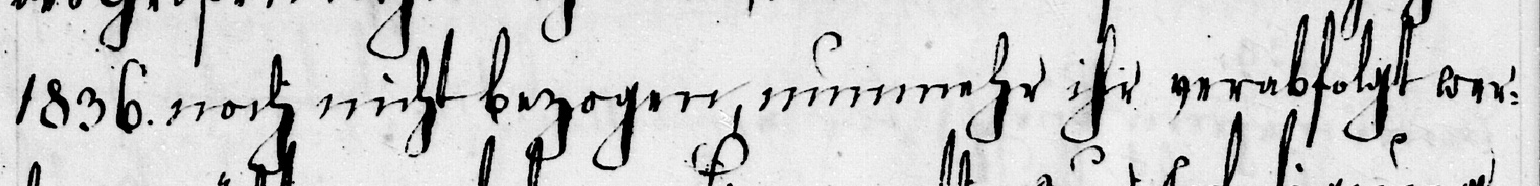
1836. noch nicht bezogen, nunmehr ihr verabfolgt wer¬
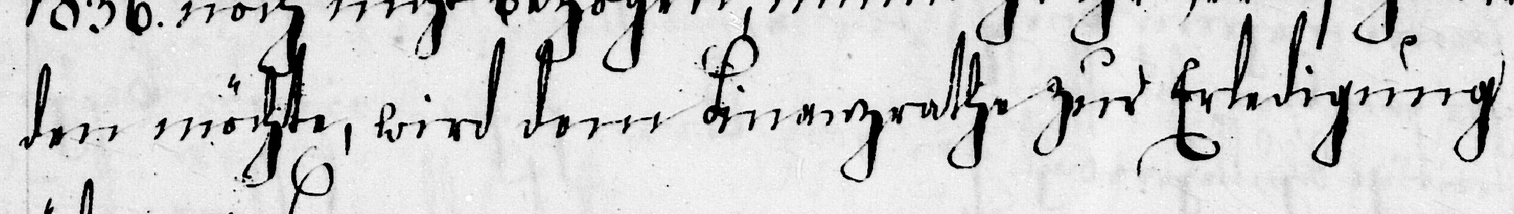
den möchte, wird dem Finanzrathe zur Erledigung
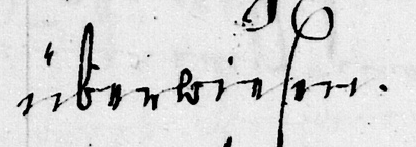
überwiesen.
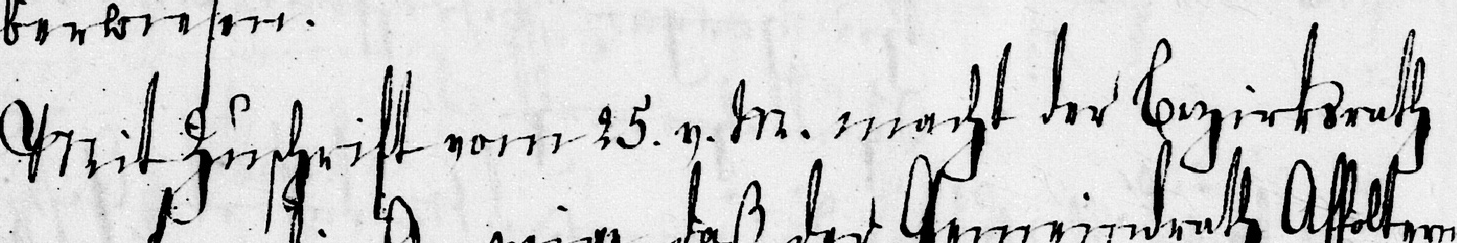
Mit Zuschrift vom 25. v. M. macht der Bezirksrath
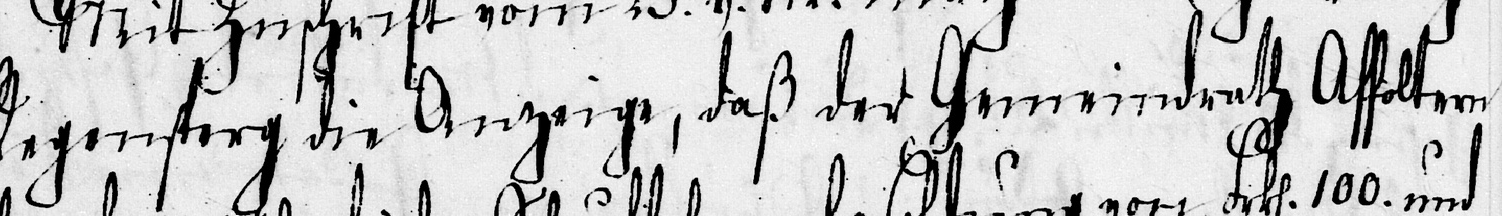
Regensperg die Anzeige, daß der Gemeindrath Affoltern
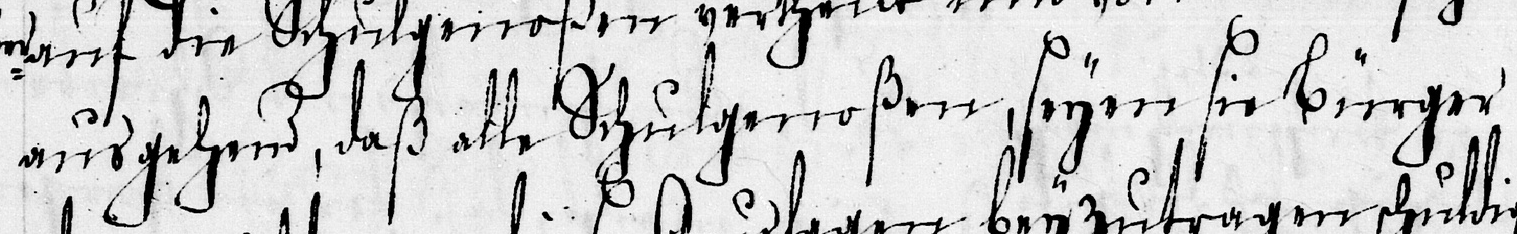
ausgehend, daß alle Schulgenoßen, seyen sie Bürger
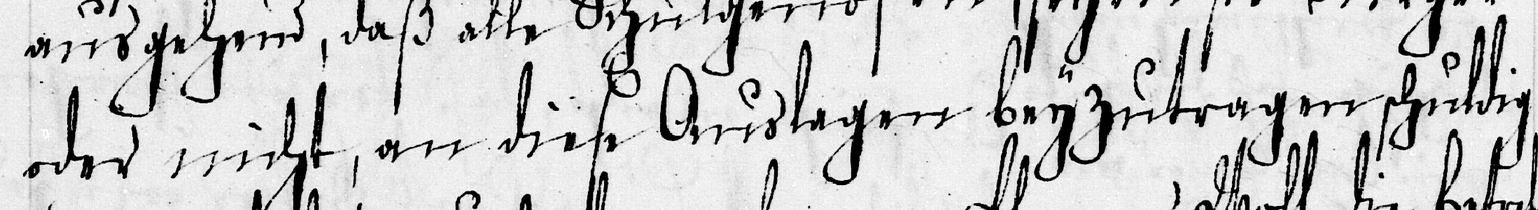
oder nicht, an diese Auslagen beyzutragen schuldi¬
